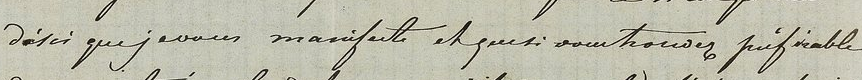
désir que je vous manifeste et que si vous trouvez préférable
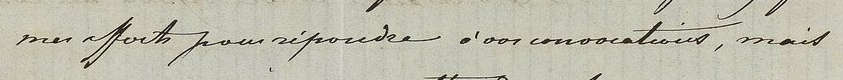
mes efforts pour répondre à vos convocations, mais
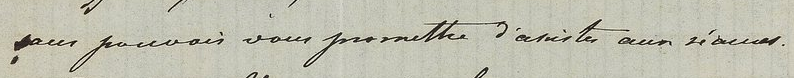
sans pouvoir vous promettre d'assister aux séances.
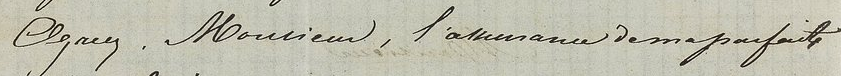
Agreez, Monsieur, l'assurance de ma parfaite
